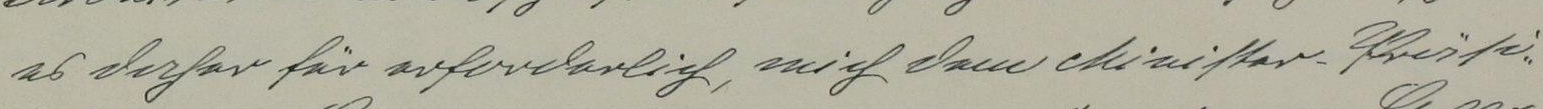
es daher für erforderlich, mich dem Minister-Präsi-
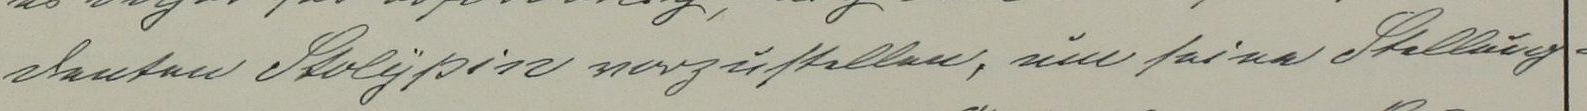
denten Stolypin vorzustellen, um seine Stellung-
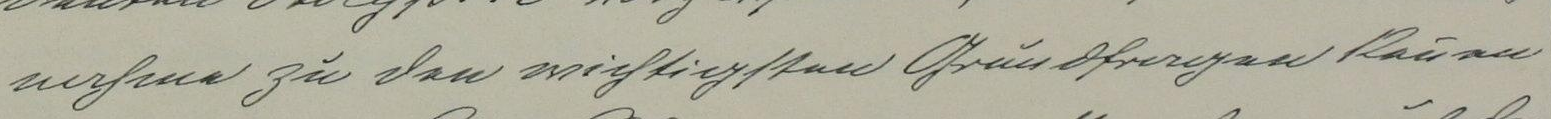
nahme zu den wichtigsten Grundfragen kennen
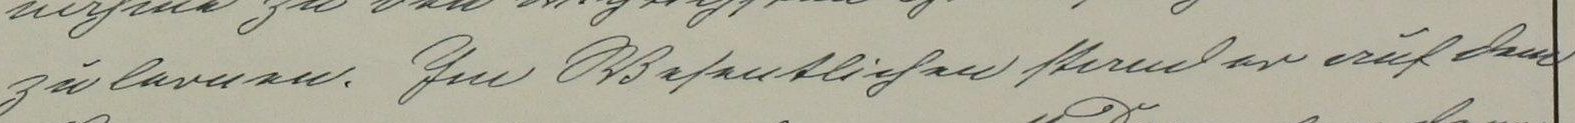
zu lernen. Im Wesentlichen stand er auf dem
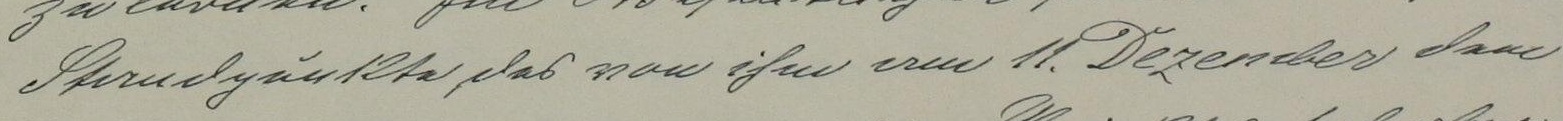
Standpunkte des von ihm am 11. Dezember dem
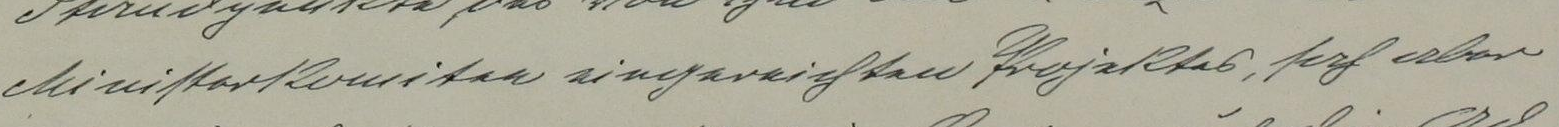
Ministerkomitee eingereichten Projektes, sah aber
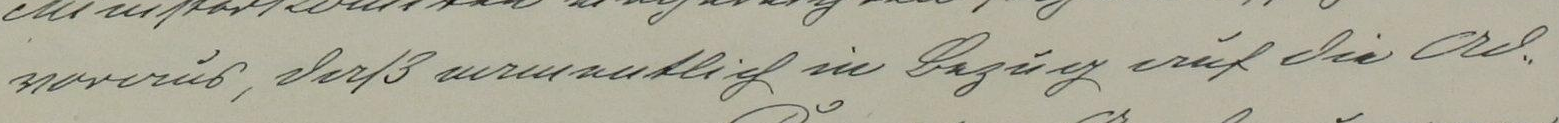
voraus, daß namentlich in Bezug auf die Ad-
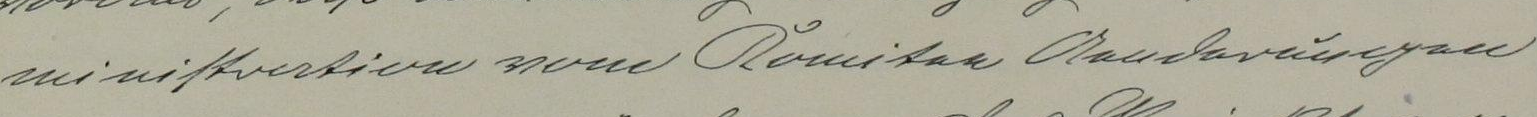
ministration vom Komitee Aenderungen
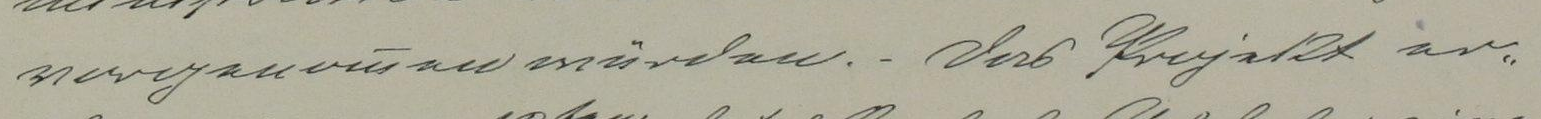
vorgenommen würden. – Das Projekt er-
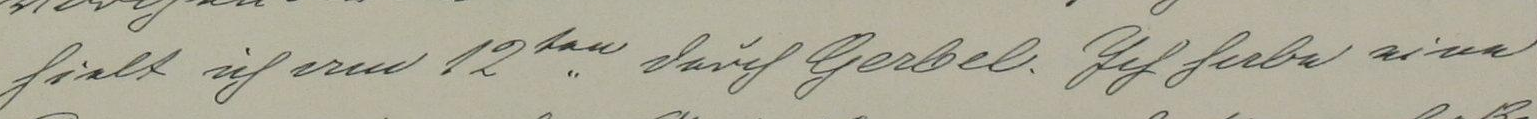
hielt ich am 12ten durch Gerbel. Ich habe eine
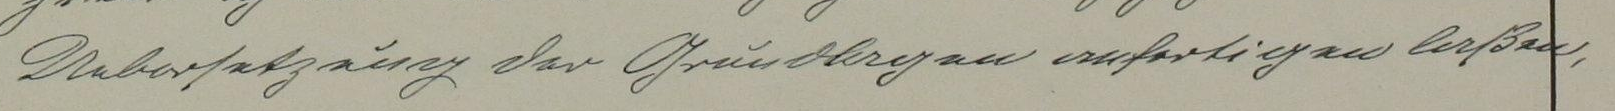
Uebersetzung der Grundlagen anfertigen laßen,
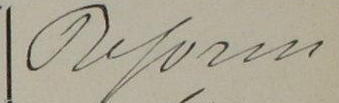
Reform
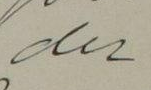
der
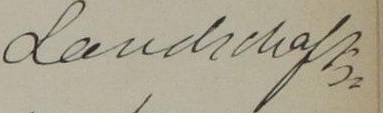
Landschafts-
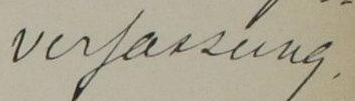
verfassung
